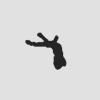又
